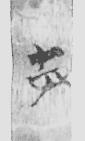{十四}
